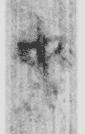中
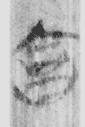合
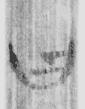曰
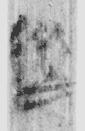從
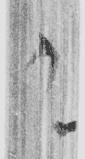人
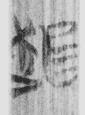𧻚
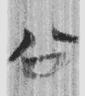公
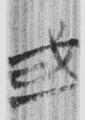或
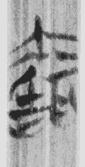{尒䎽}
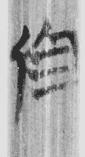於
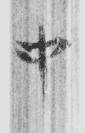中
